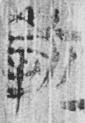新
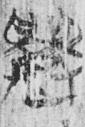與
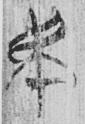民
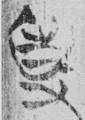事
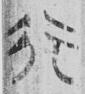行
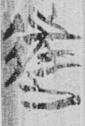○（往）
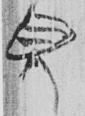視
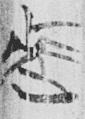逨（來）
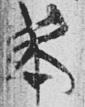民
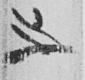之
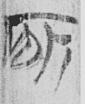所
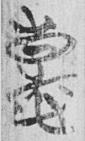○（喜）
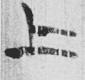上
